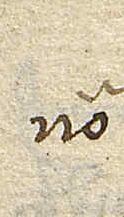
no*
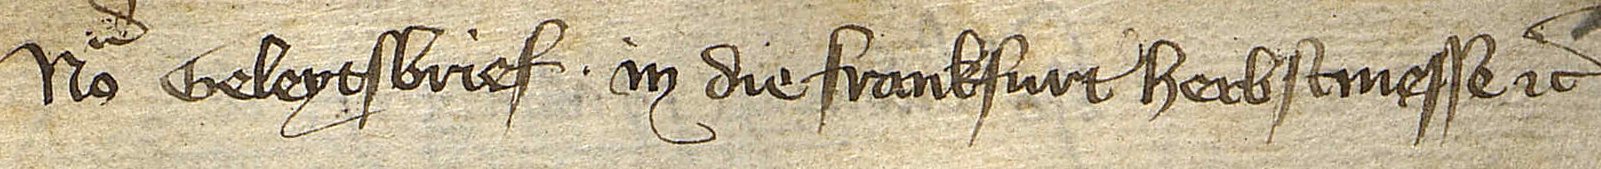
No* Geleytſbrief in die frankfurt* herbſtmeſſe ec*
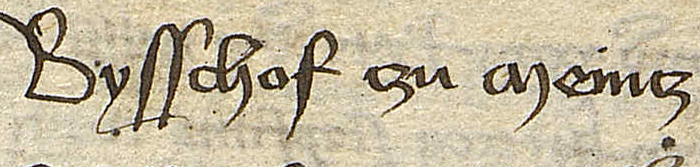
Byſſchof cʒu Meincʒ
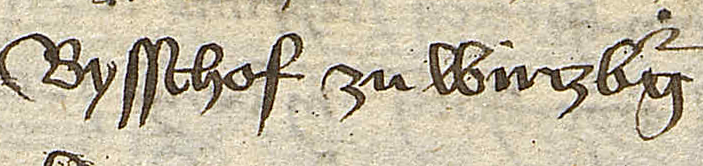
Byſſchof ʒu Wircʒb*g
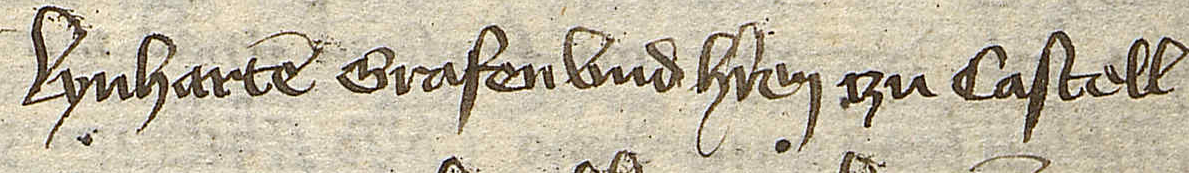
Lynharte* Grafen vnd h*ren cʒu Caſtell
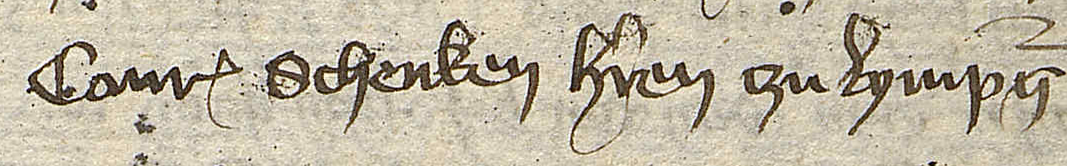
Conr* Schenken h*ren cʒu Lymp*g
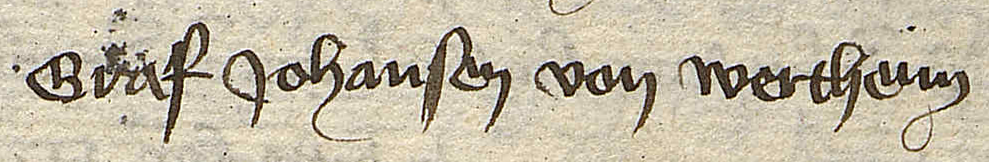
Graf Iohanſen von wertheim
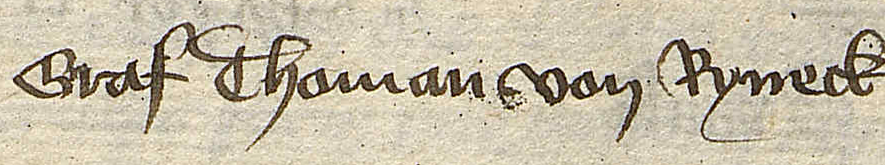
Graf Thoman von Ryneck
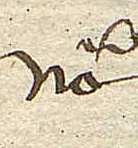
No*
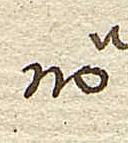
no*
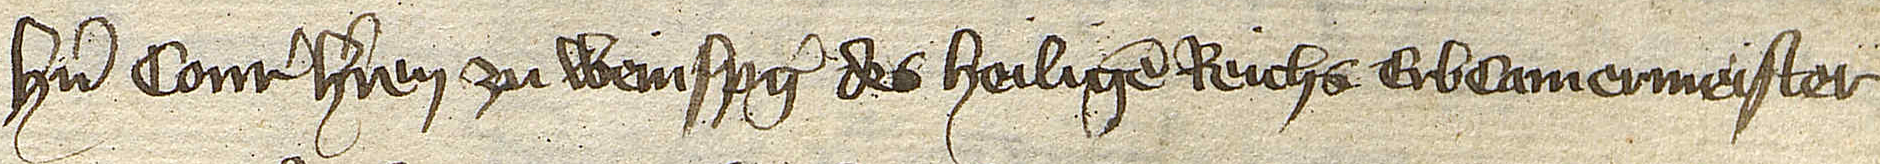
hn* Conr* h*ren ʒu Weinſp*g des heilige* Reichs Erb Camermeiſter
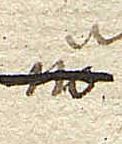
no*
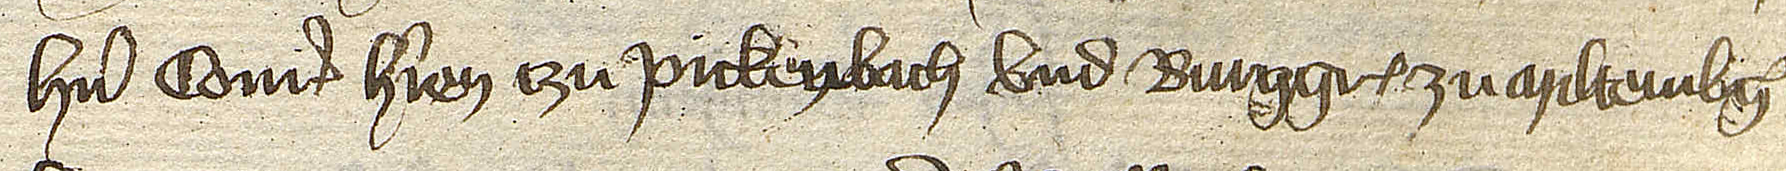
hn* Conr* h*ren cʒu Pickenbach vnd Burggr* cʒu Miltemb*g
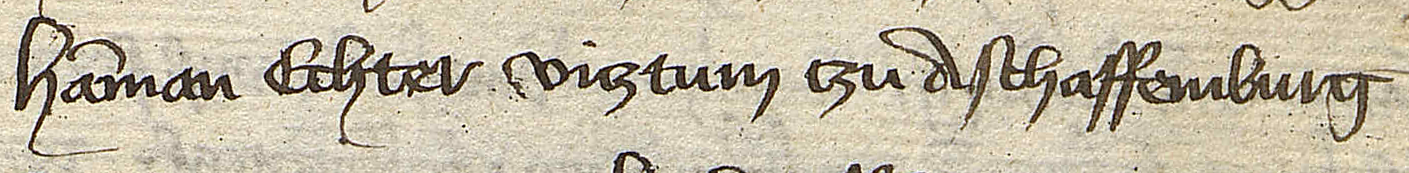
ha*man Echter vicʒtum cʒu Aſchaffemburg
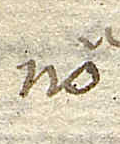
no*
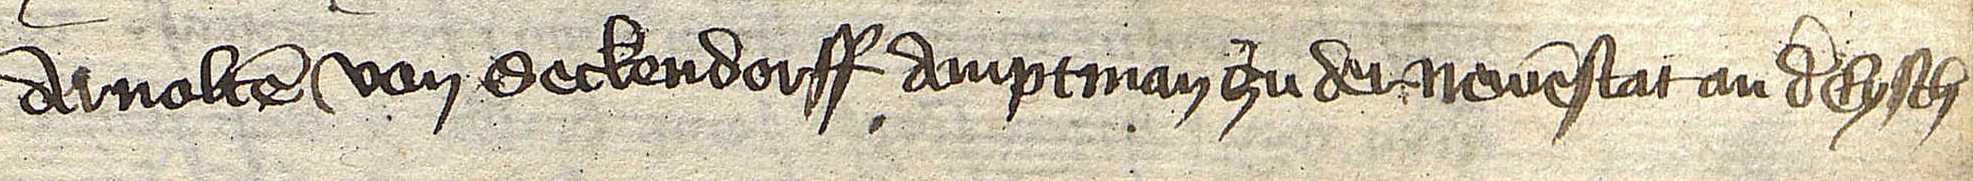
Arnolte* von Seckendorff Amptman cʒu der newe*ſtat an d* Eyſch
